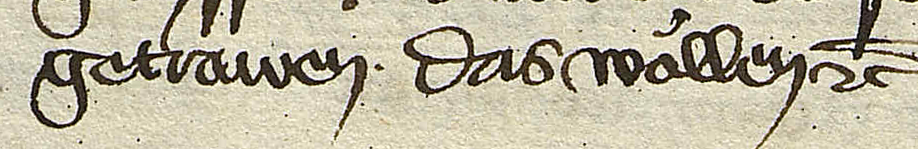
getrawen . Das wöllen ec*
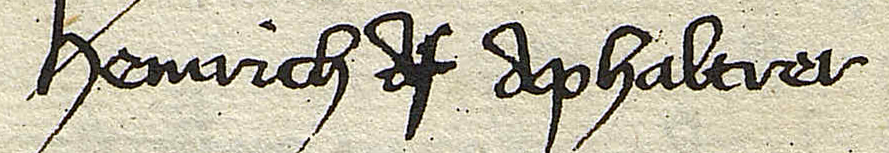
Heinrich Af Aphaltrer
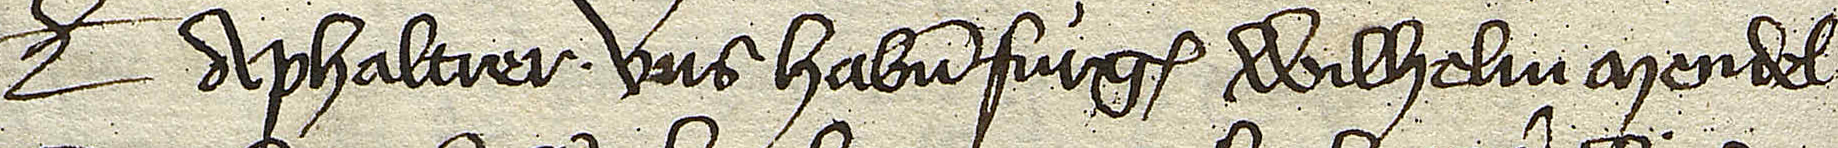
L* Aphaltrer. Vns habn* fürg* Wilhelm Mendel
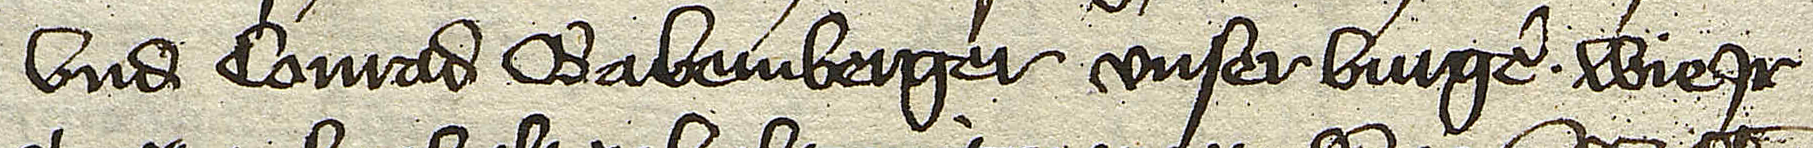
vnd Conrad Babemberge vnſer burge* . wie Ir
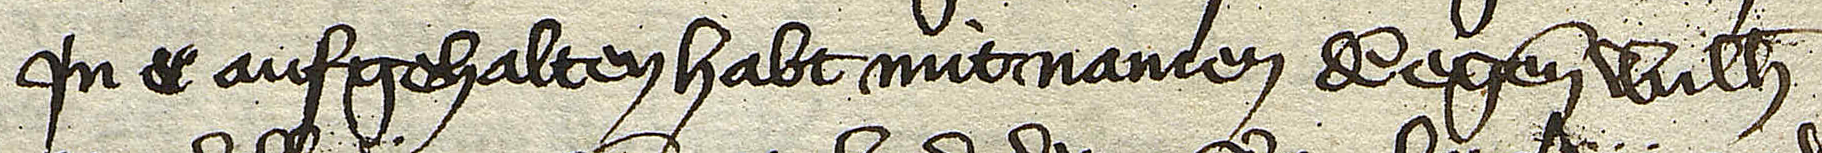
In a aufgehalten habt mitnamen d* egen* Wilh*
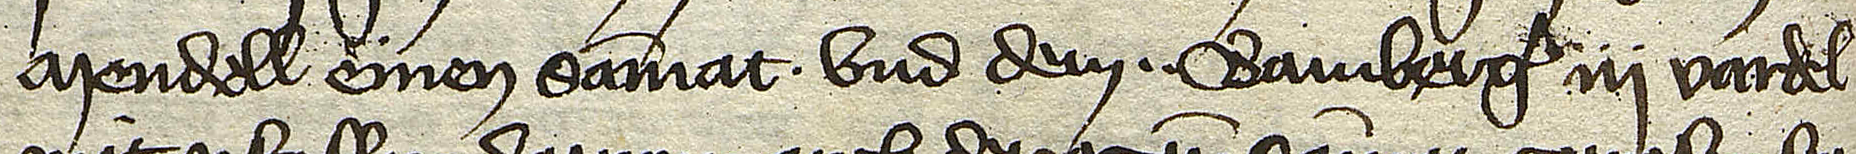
Mendell einen Samat* . Vnd dem ~ Bamberg* iii vardel
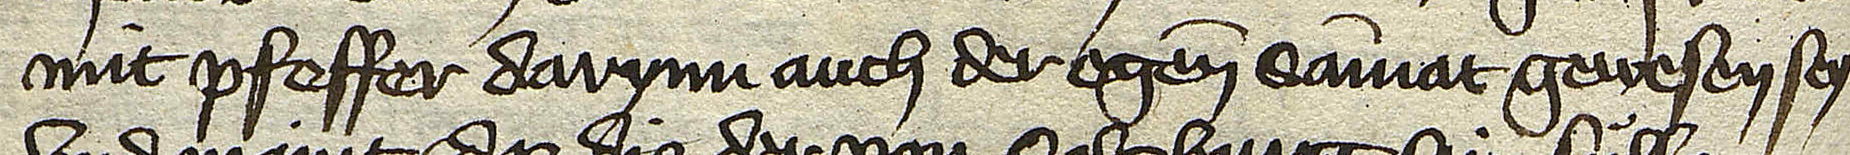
mit pfeffer darynn auch der egen* Samat* geweſen ſey
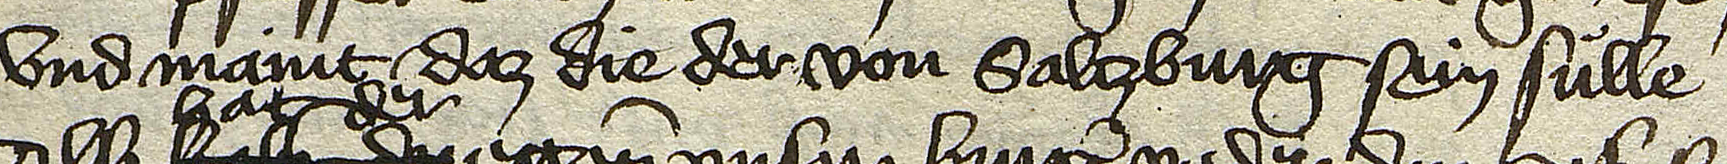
vnd maint / daʒ die der von Salʒburg ſein ſülle
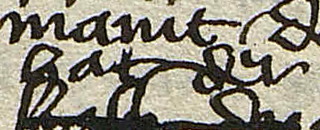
hat der
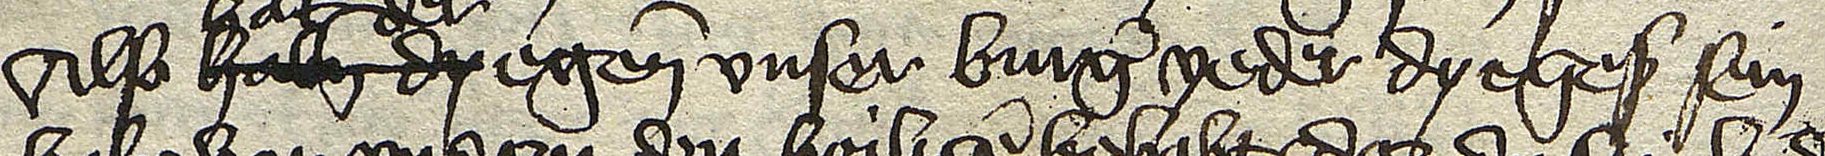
Alſo habn* dy egen* vnſer burg* yeder dy egeſ* ſein
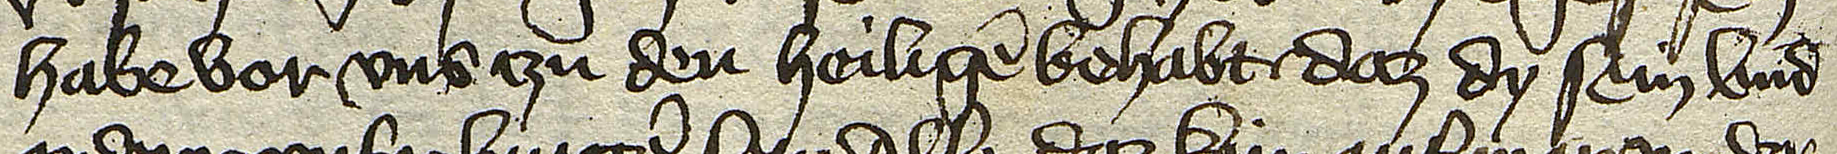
habe vor vns cʒu den heilige* behabt / daʒ dy ſein vnd
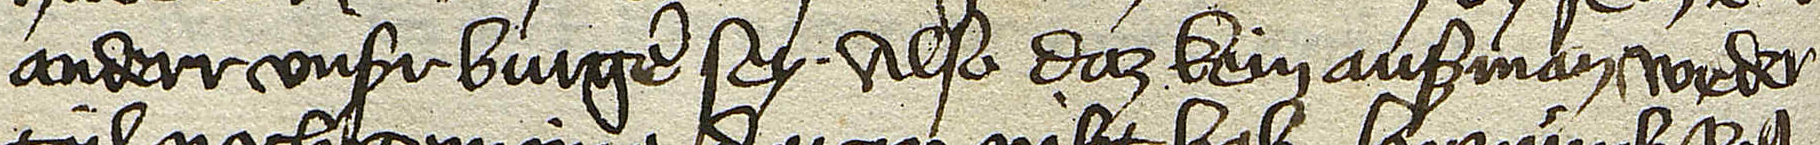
anderr vnſ*r burge* ſey . Alſo daʒ kein auſʒman weder
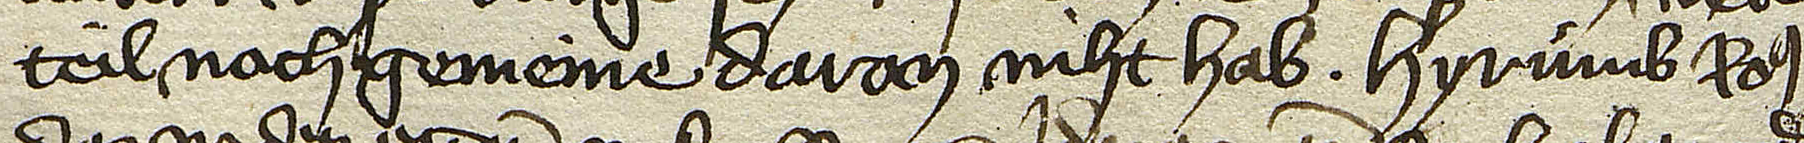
teil noch gemeine daran niht hab . Hyrümb Ro*
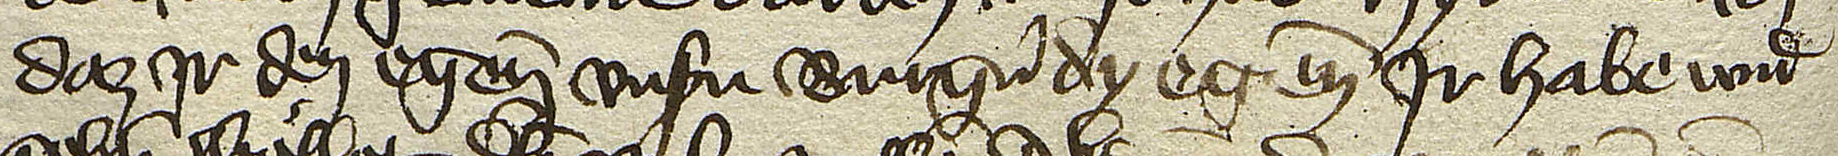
daʒ Ir den egen* vnſ*n Burgn* dy egen* Ir habe wid*
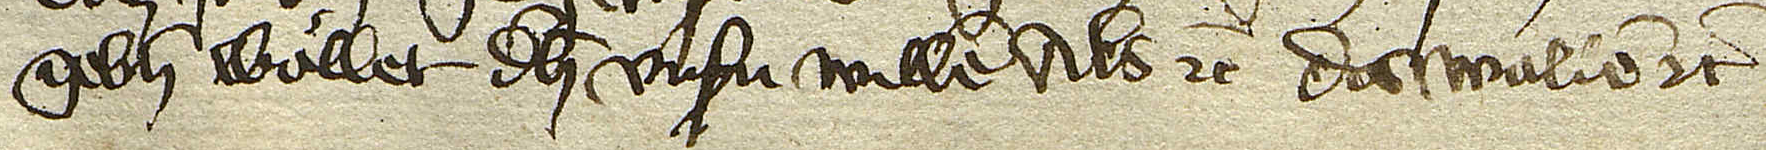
gebn* wöllet dh* vnſ*n wille* Als ec* das wolle* ec*
